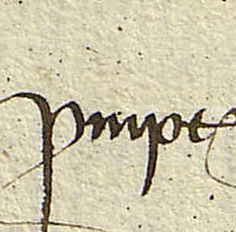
Pr*mpt*
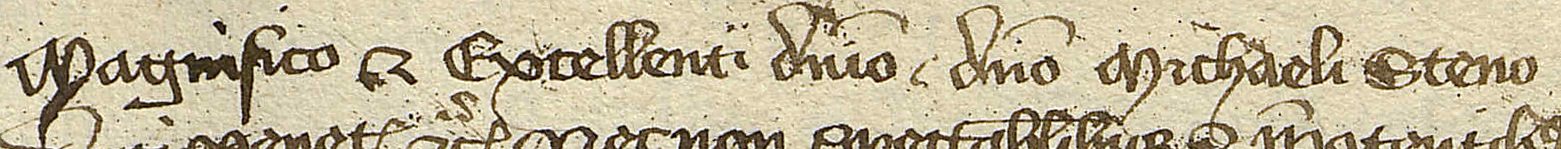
Magnifico @ Excellenti d*m*io / d*no Michaeli Steno
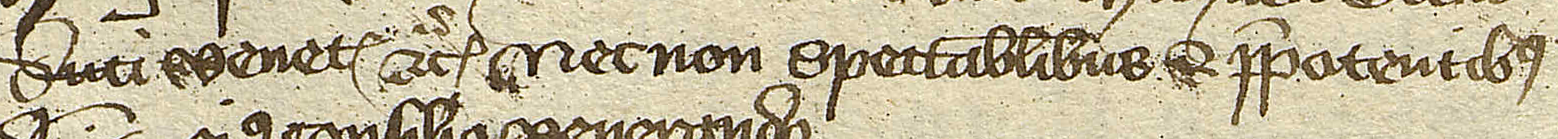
Duci Venet* ec* Nec non Spectab*libus @ p*potentib*
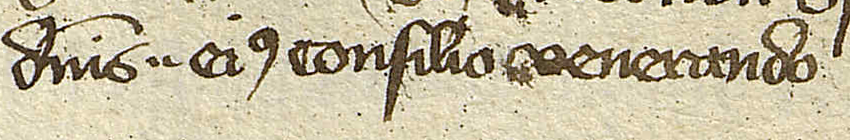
d*nis ~ ei* conſilio venerando
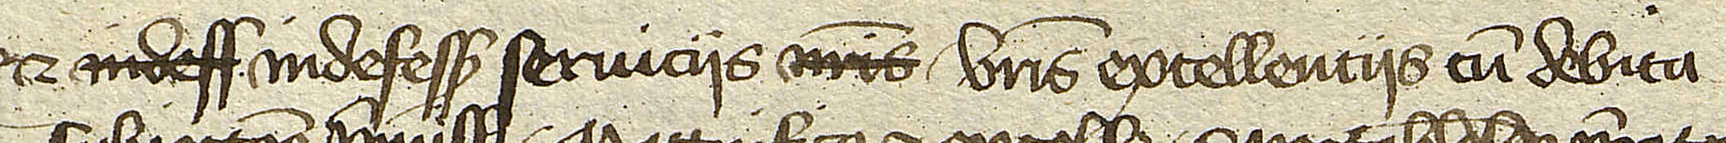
@ indeſſ indefeſſ* ſeruiciis nris* / v*ris excellentiis cu* debita
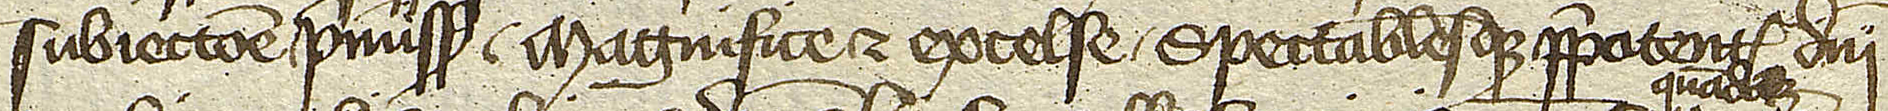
ſubiect*o*e p*miſſ* / Magnifice @ excelſe / Spectab*lesq* p*potent* d*ni
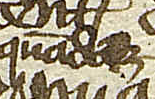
qua*d*
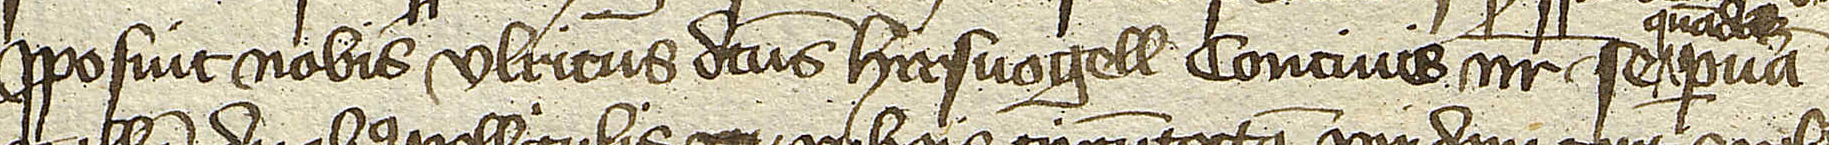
P*poſuit nobis Vlricus d*c*us Hirsuogell Conciuis n*r / ſe p*ua*
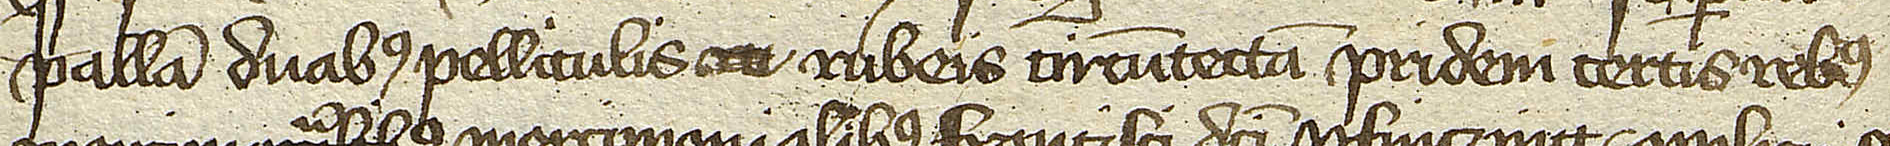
palla* duab* pelliculis ru rubeis circu*tecta* pridem certis reb*
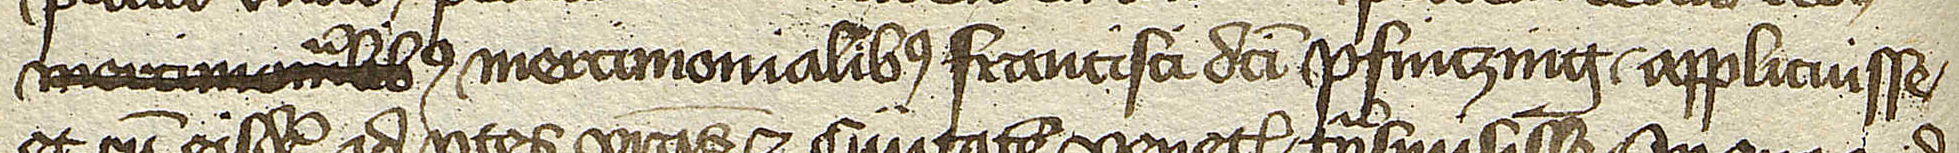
mercimoni*lib* mercimonialib* Franciſci d*c*i Pfincʒing / applicuiſſe /
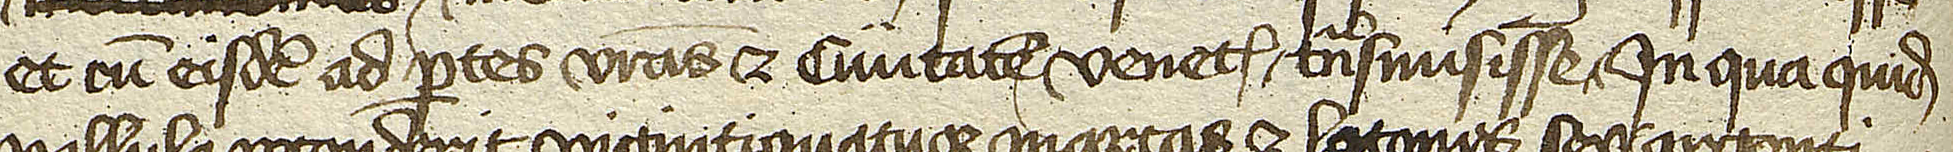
et cu* eiſde* ad p*tes v*ras @ Ciuitate* Venet* t*nſmiſiſſe / In qua quid*
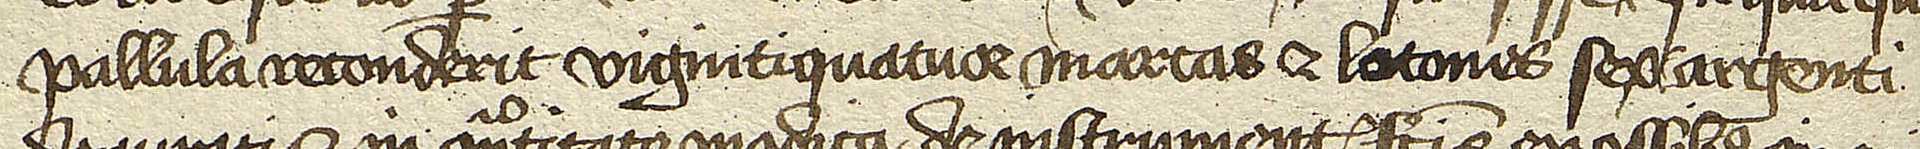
pallula reconderit vigintiquatuor marcas @ lotones sex argenti
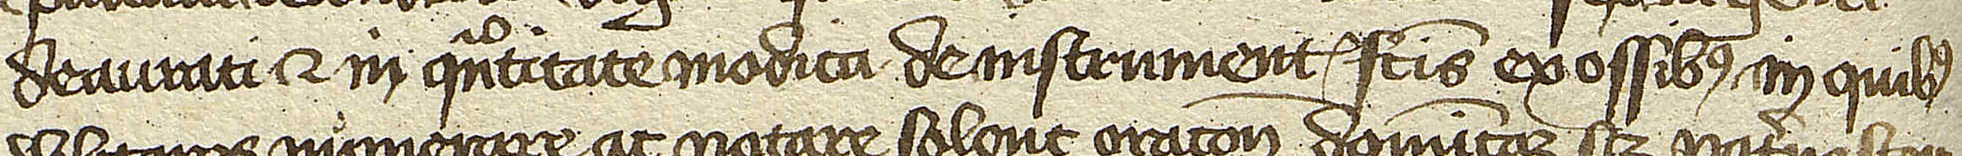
deaurati @ in q*ntitate modica / de inſtrument* f*c*i* ex oſſib* / in quib*
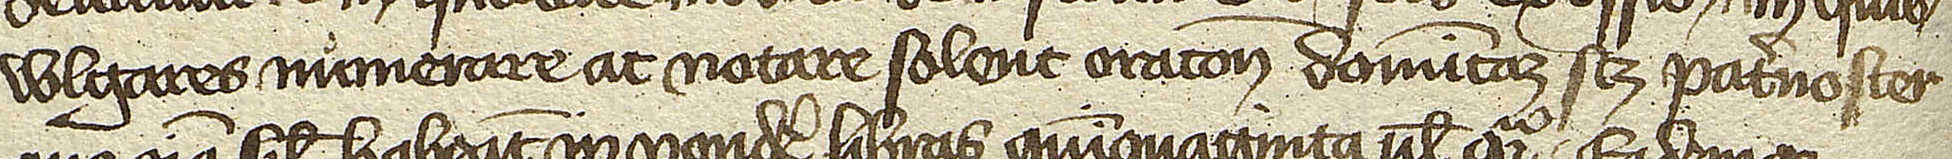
vvlgares numerare ac notare ſolent orat*on* domi*ca* ſc* pat*noſter
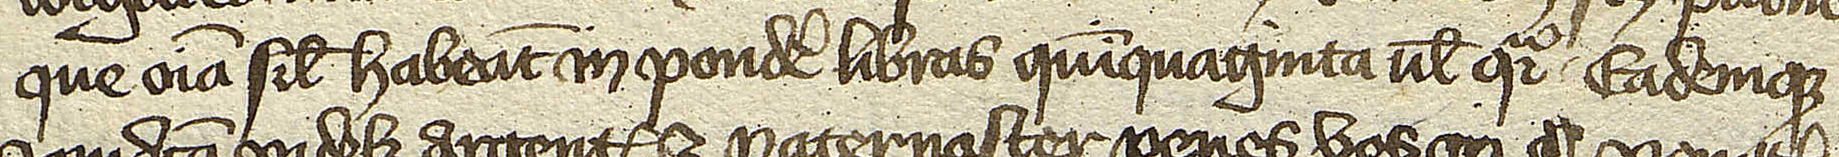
que o*ia ſi*l habea*t in ponde* libras qui*quaginta u*l q*/ Eademq*
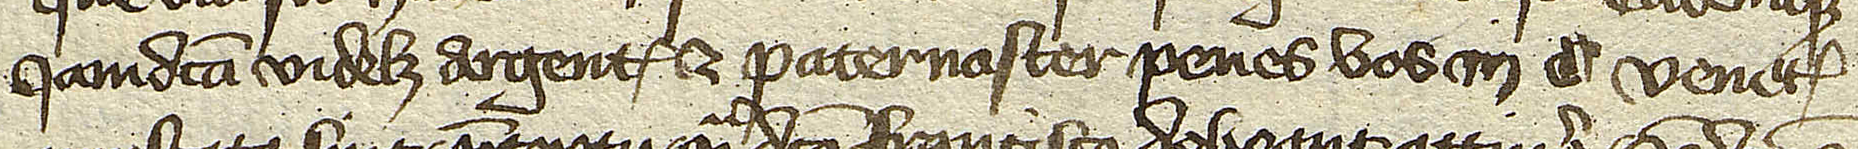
Iamd*c*a, videlic* Argent* @ paternoſter penes vos in C Venec*
